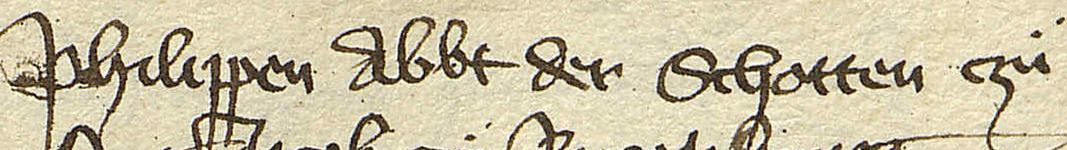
Philippen Abbt der Schotten cʒü
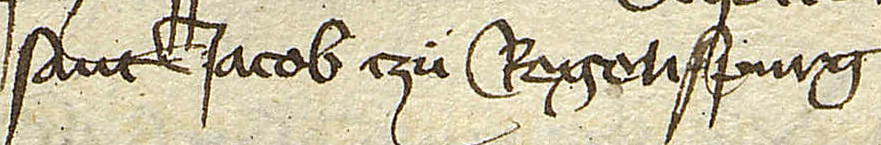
ſant Iacob cʒü Regenſpurg
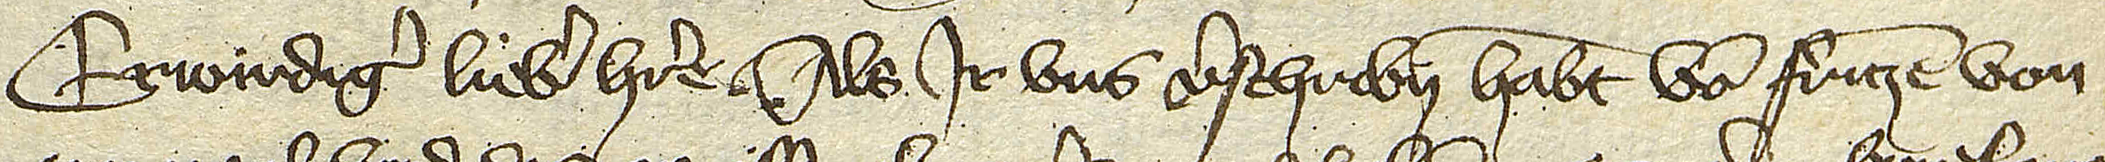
Erwirdig* lieb* hr*e / Als Ir vns v*ſchribn* habt vo* fricʒe* von
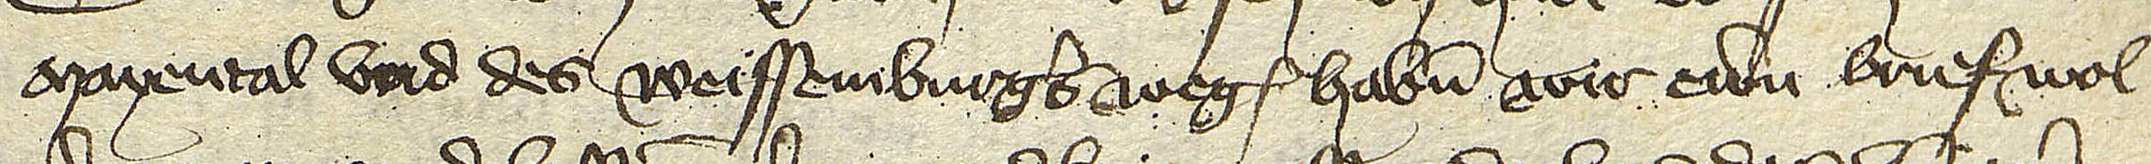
Mayental vnd des weiſſemburg*s weg* habn* wir ew*n brief wol
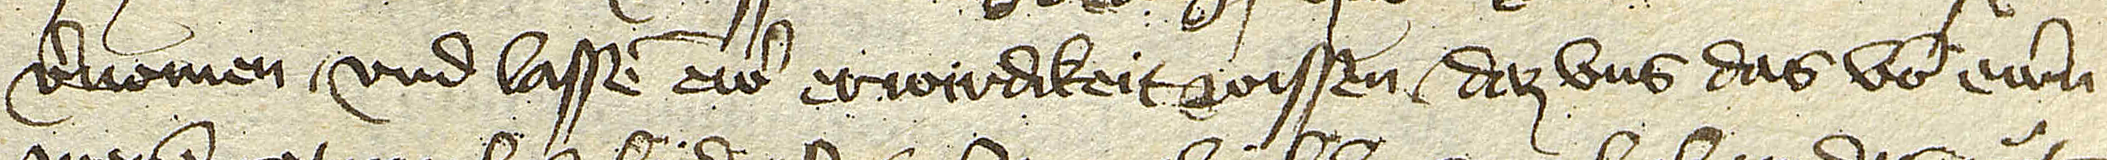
v*nomen / vnd laſſe* ew* erwirdikeit wiſſen / daʒ vns das vo* ew*n
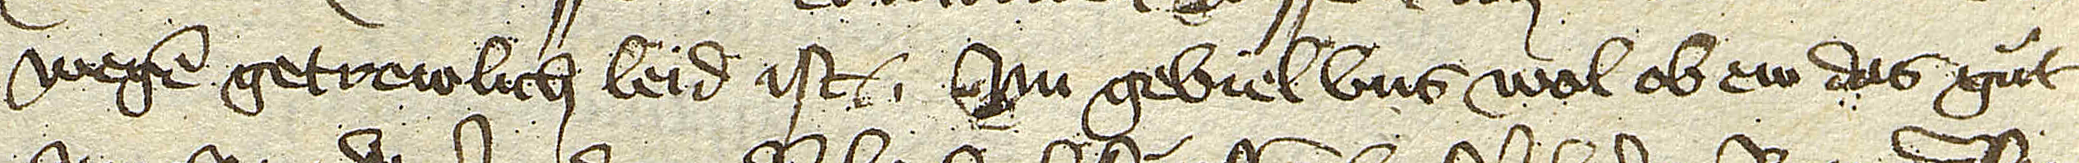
wege* getrewlich leid iſt / . Nu geviel vns wol ob ew das güt
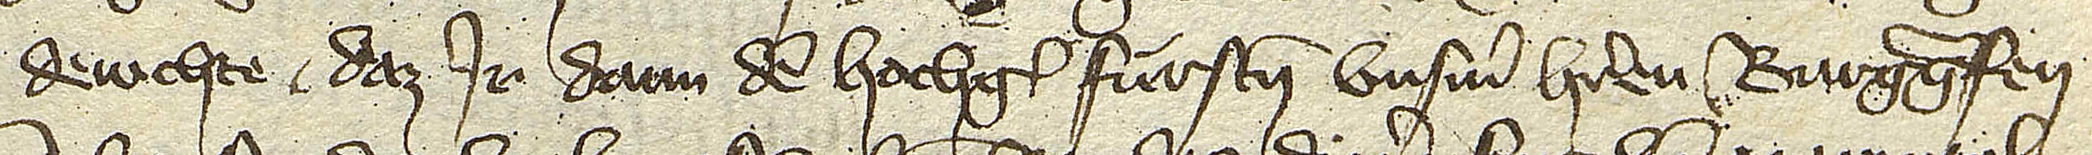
dewchte / daʒ Ir dann de* hochg* fürſtn* vnſm* hr*en Burgg*fen
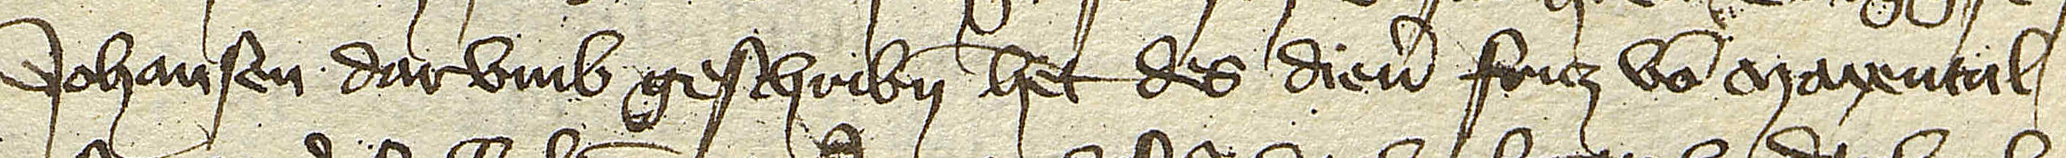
Iohanſen darvmb geſchribn* het des dien* fricʒ vo* Mayental
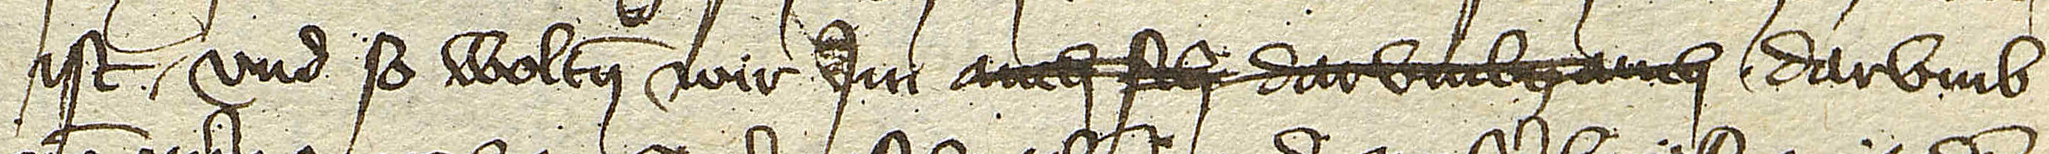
iſt / vnd ſo woltn* wir Im auch ſch darvmb g auch / darvmb
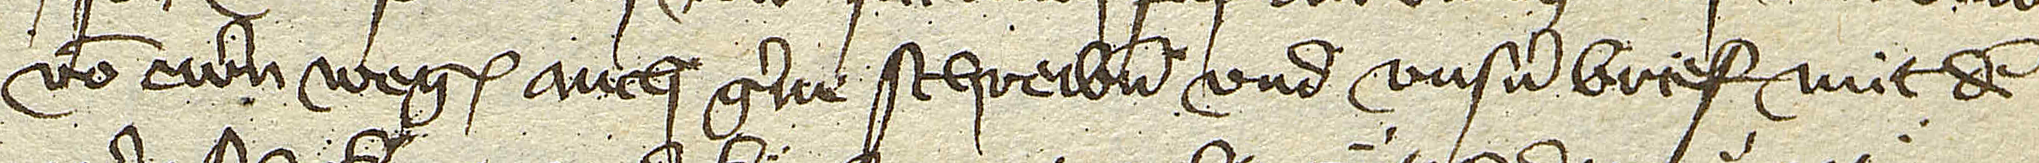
vo* ew*n weg* auch g*ne ſchreibn* vnd vnſn* brief mit d*
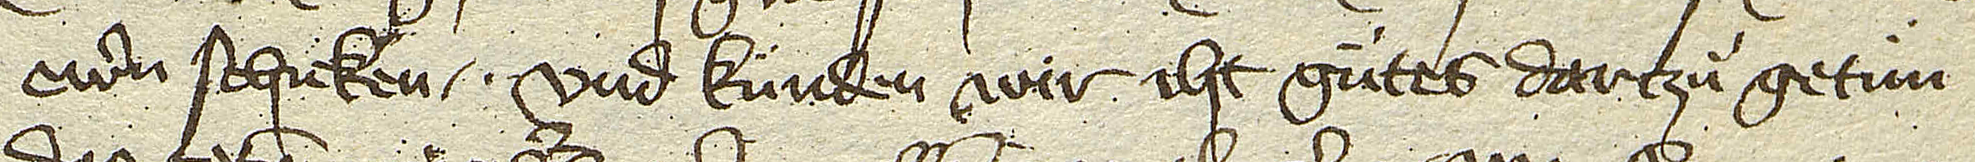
ew*n ſchicken / . vnd künden wir iht gütes darcʒü getün
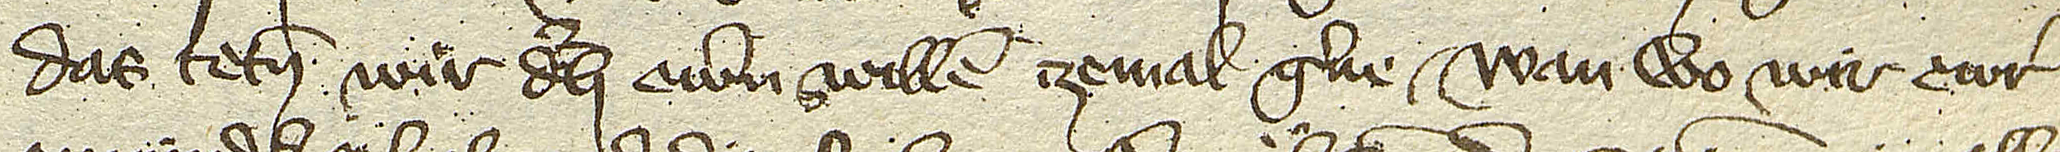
das tetn* wir d*h ew*n wille* cʒemal g*ne / wan wo wir ewr*
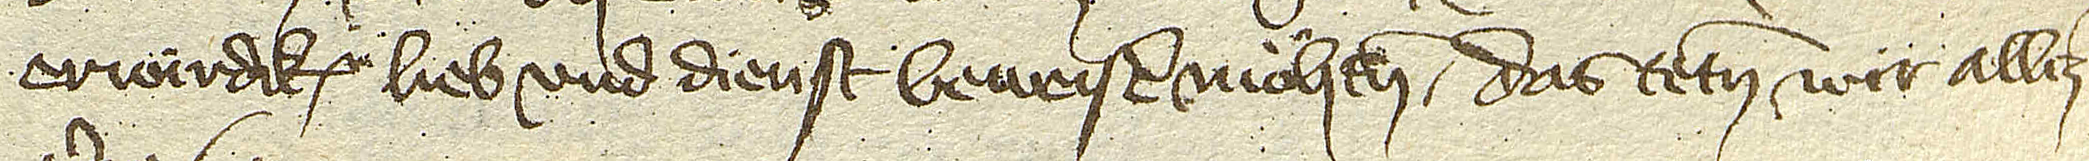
erwirdik* lieb vnd dienſt beweiſe* möhtn* / Das tetn* wir allcʒ*
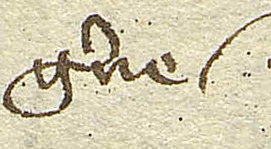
g*ne / .
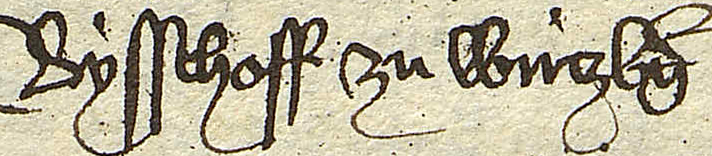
Byſſchoff cʒu wircʒb*g
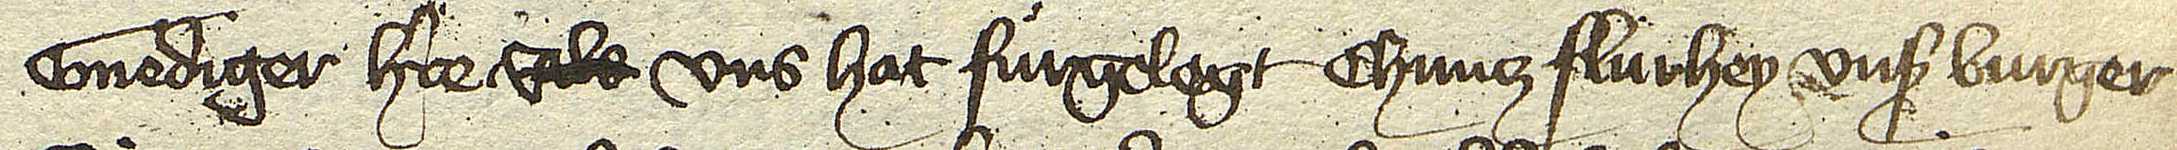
Gnediger h*re / Als vns hat fürgelegt Chuncʒ flurhey vnſ* burger
